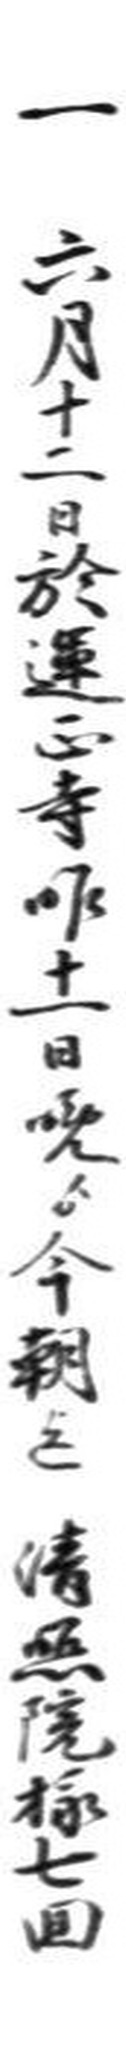一六月十二日於運正寺昨十一日晩ゟ今朝迄清照院様七回
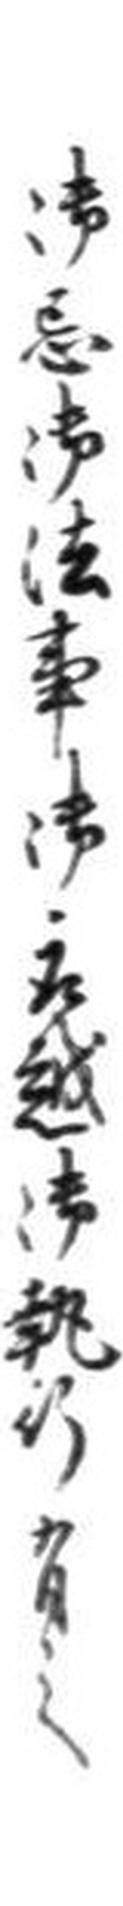御忌御法事御取越御執行有之
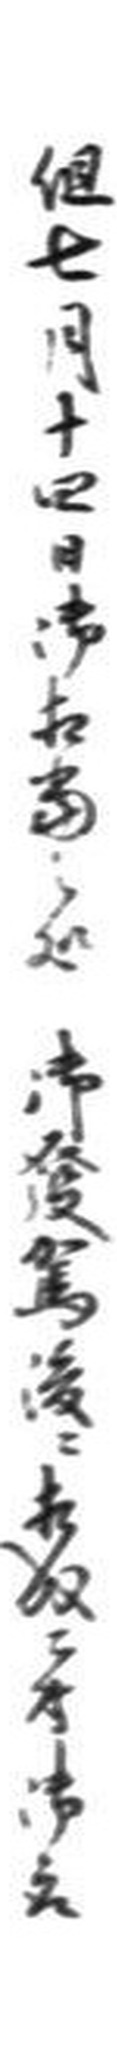但七月十四日御相当之処御発駕後ニ相成ニ付御取
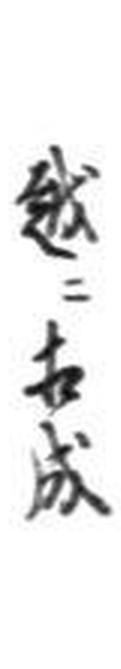越ニ相成
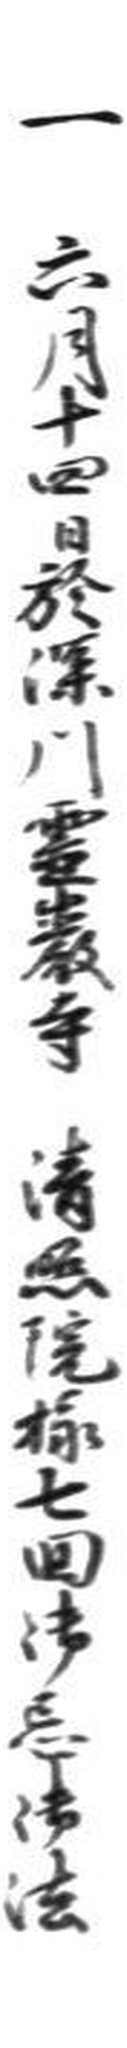一六月十四日於深川霊厳寺清照院様七回御忌御法
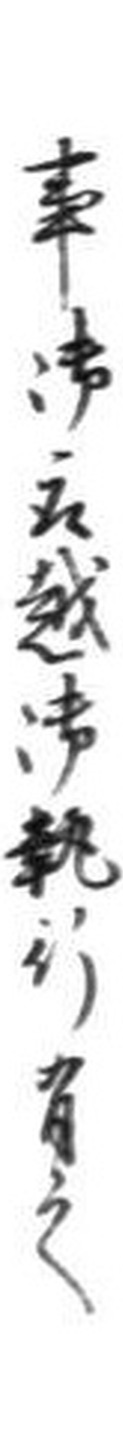事御取越御執行有之
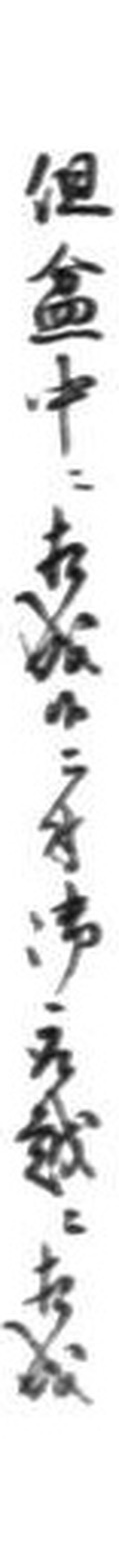但盆中ニ相成候ニ付御取越ニ相成
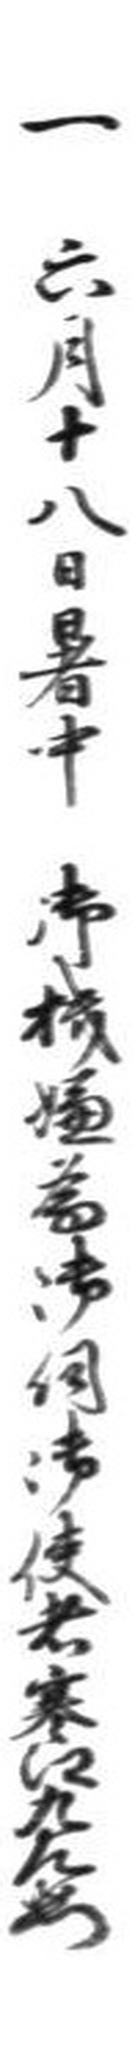一六月十八日暑中御機嫌為御伺御使者寒江九左衛門
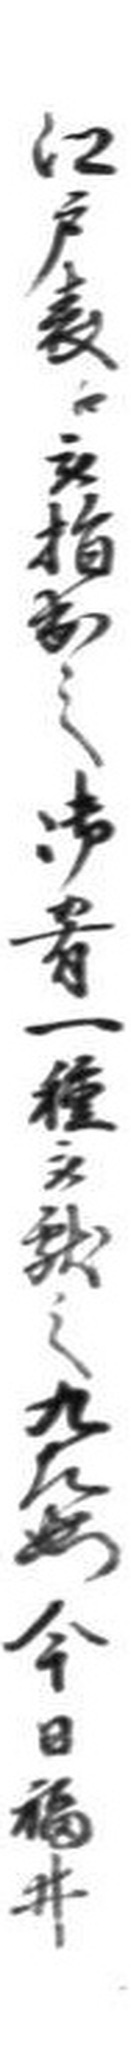江戸表江被指出之御肴一種被献之九左衛門今日福井

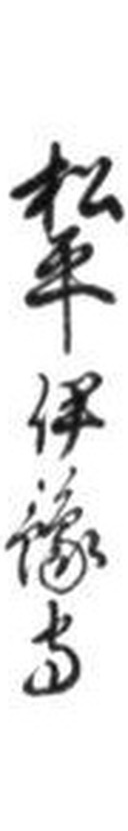松平伊予守
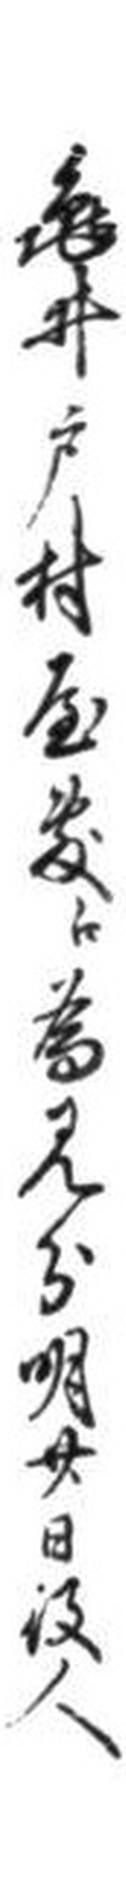亀井戸村屋敷江為見分明廿日役人
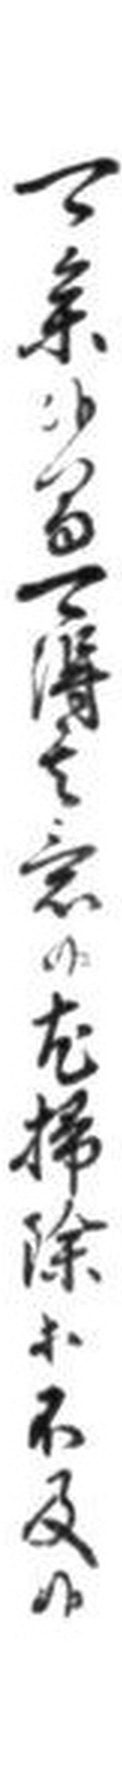可参候間可得其意候尤掃除等不及候
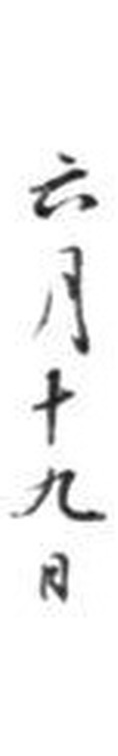六月十九日
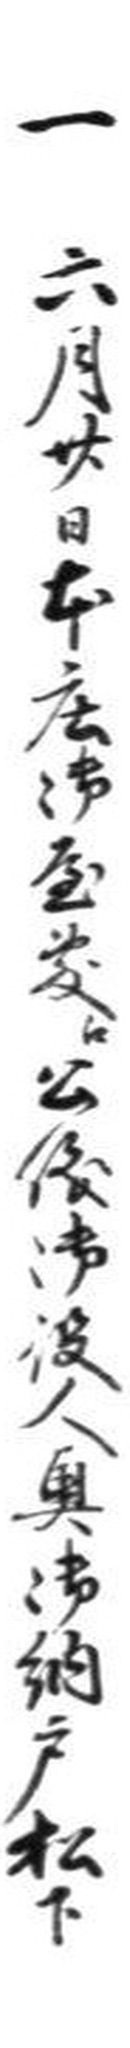一六月廿日本庄御屋敷江公儀御役人奥御納戸松下
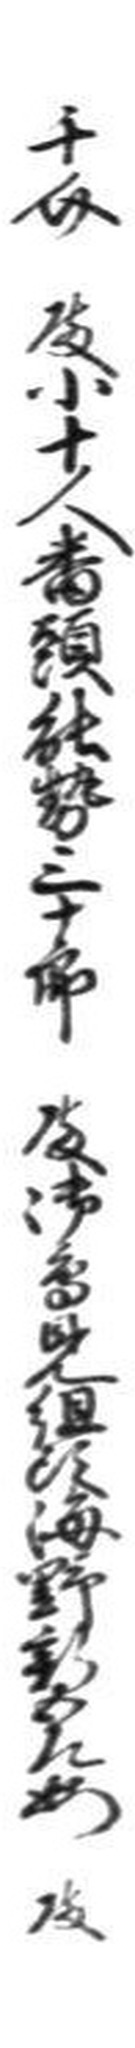千介殿小十人番頭能勢三十郎殿御鳥見組頭海野新五左衛門殿
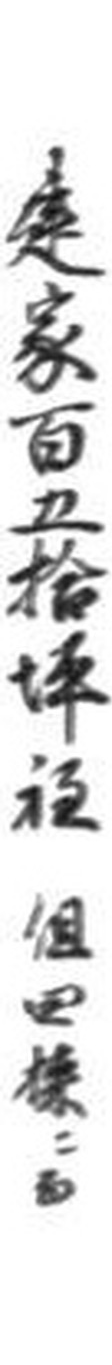建家百五拾坪程但四棟ニ而
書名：家譜 三十二 吉邦公 従享保二年到享保三年
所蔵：福井県文書館 Fukui Prefectural Archives
